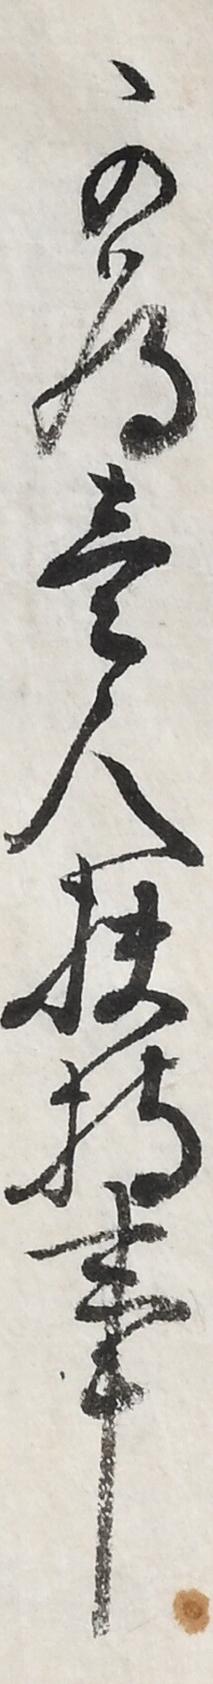可為壱人扶持事
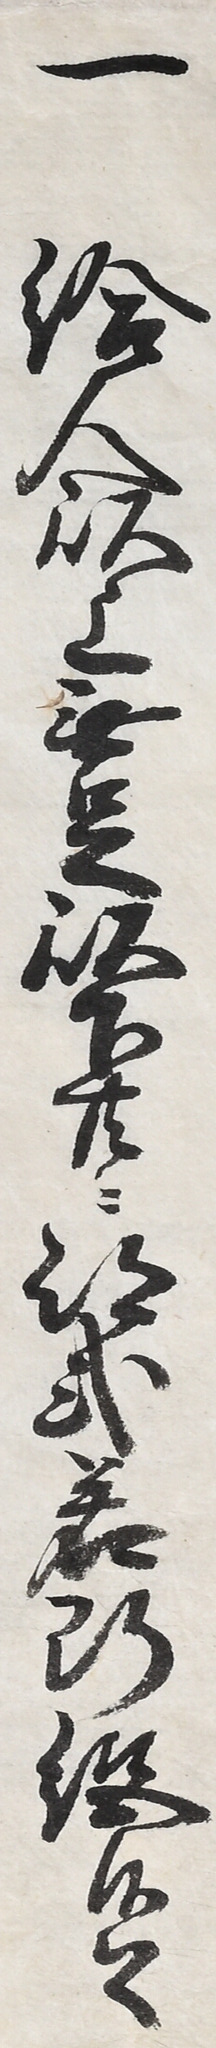一給人以上無足以下共ニ跡式若断絶候ハヽ
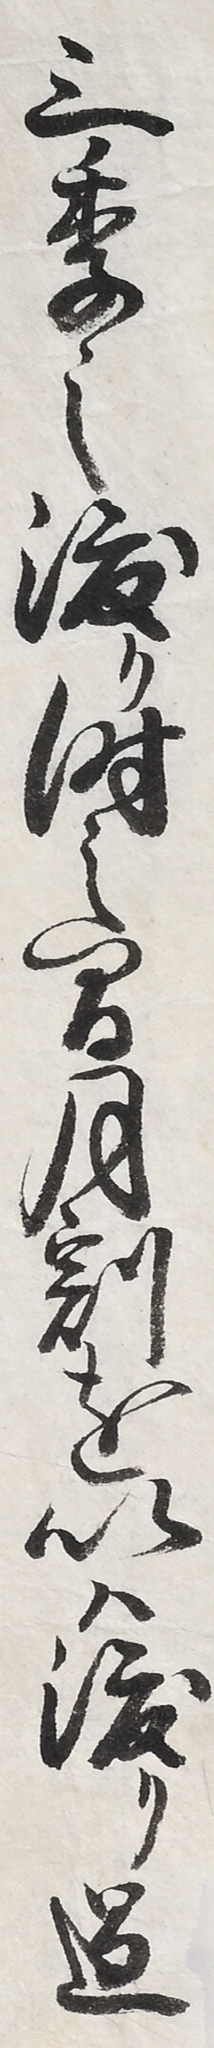三季之渡リ時之間月割を以ハ渡リ過
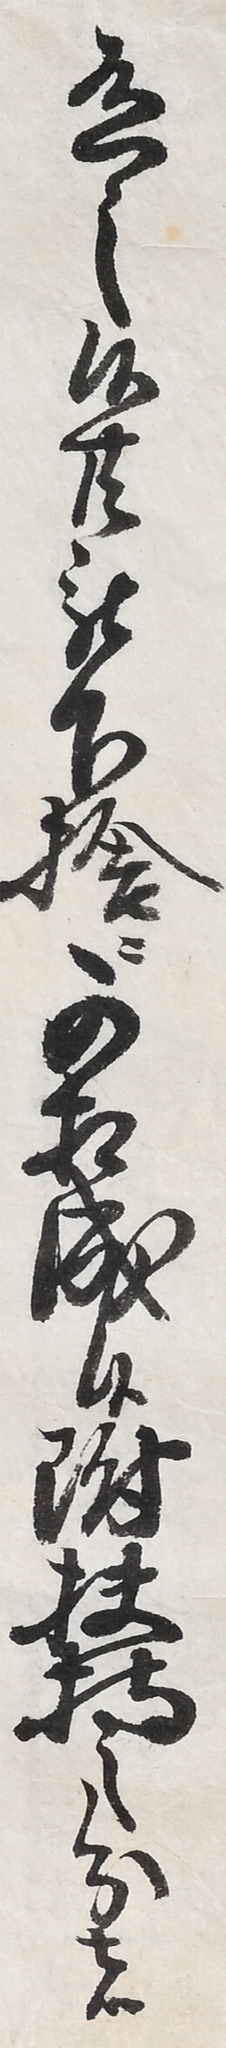有之候共被下捨ニ可相成候附扶持之分葉
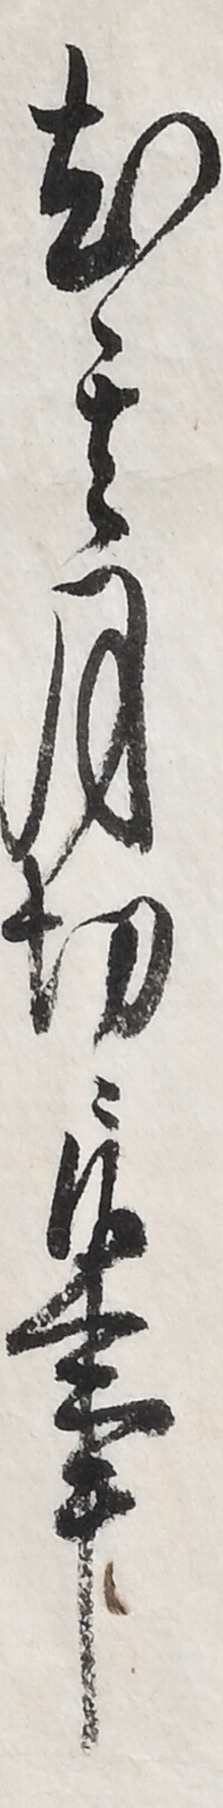尤其月切ニ候事
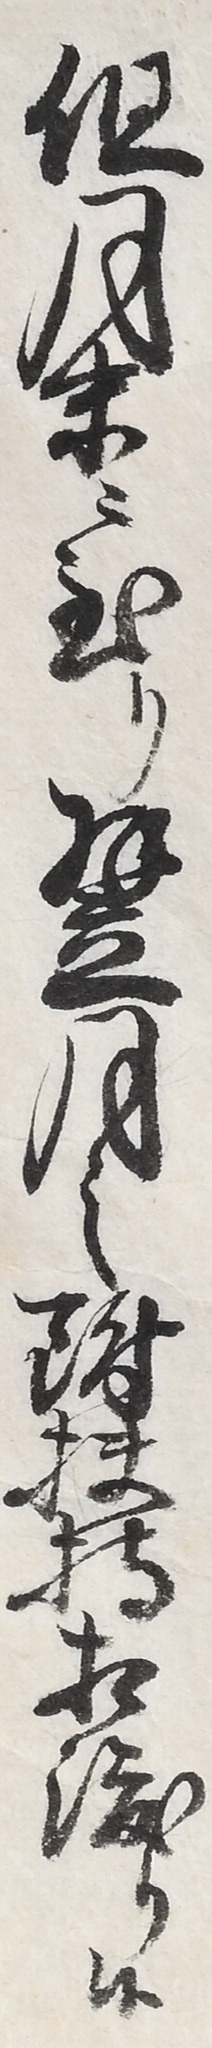但月末ニ至リ翌月之時扶持相渡リ候
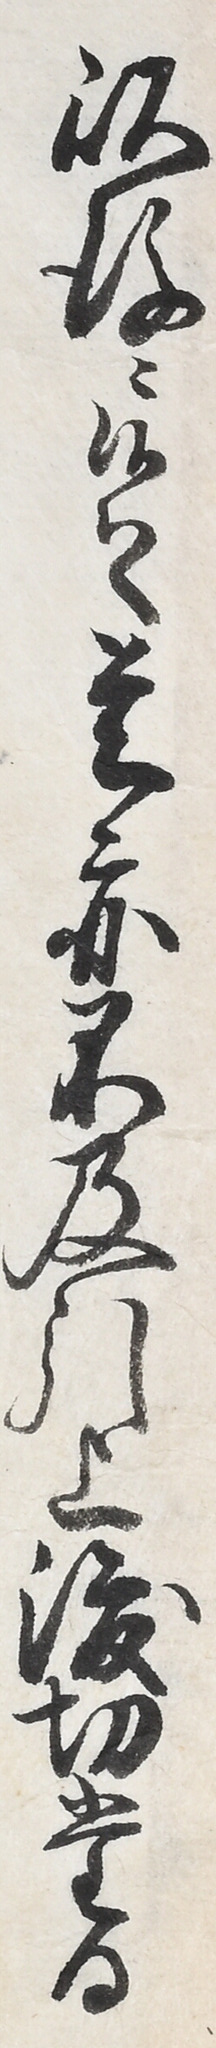以後ニ候ハヽ是亦不及引上渡切たる
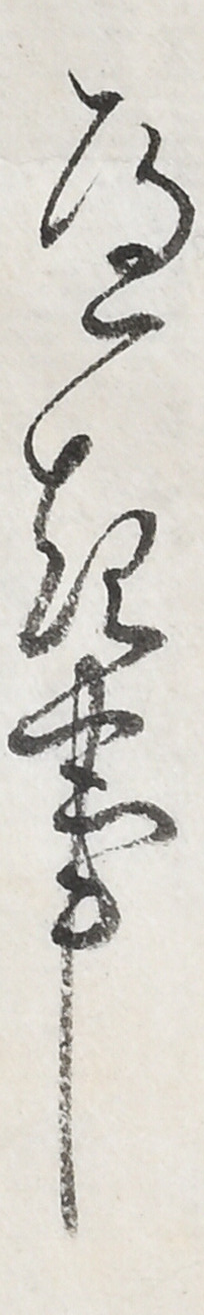へき事
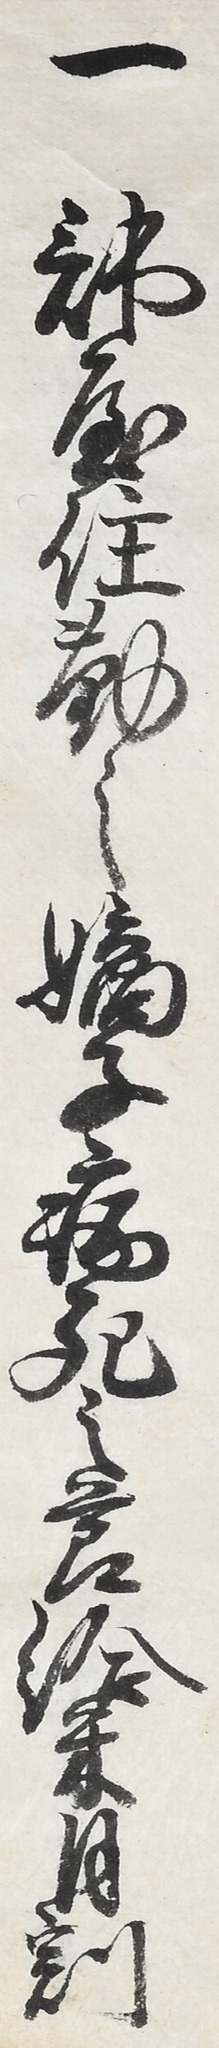一部屋住勤之嫡子病死之節給米月割
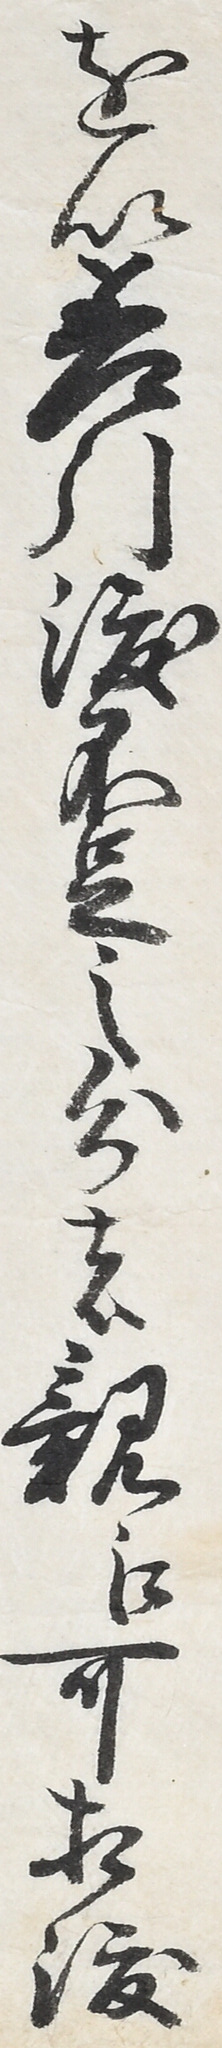を以差引渡不足之分は親江可相渡
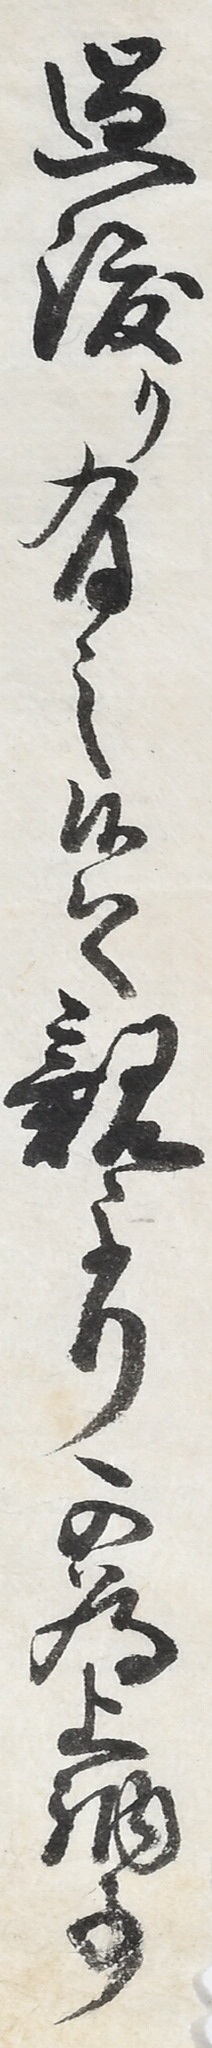過渡リ有之候ハヽ親より可為上納事
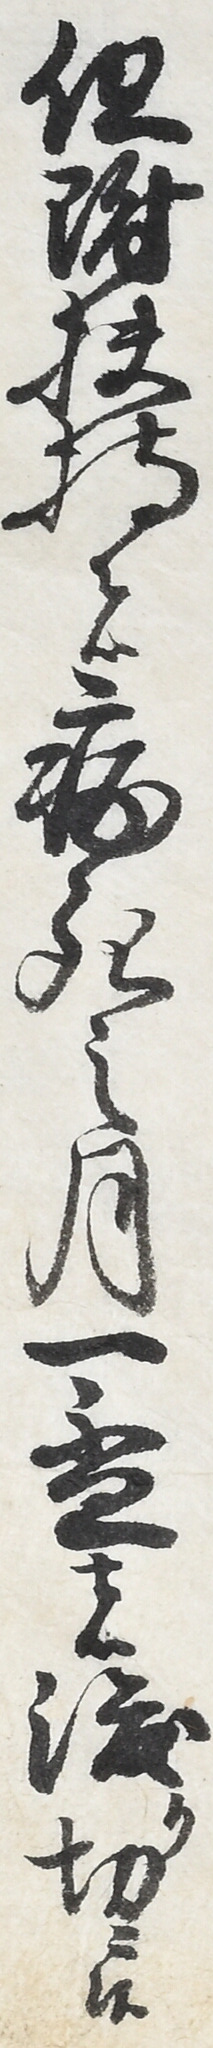但附扶持は病死之月一盃は渡リ切ニ候
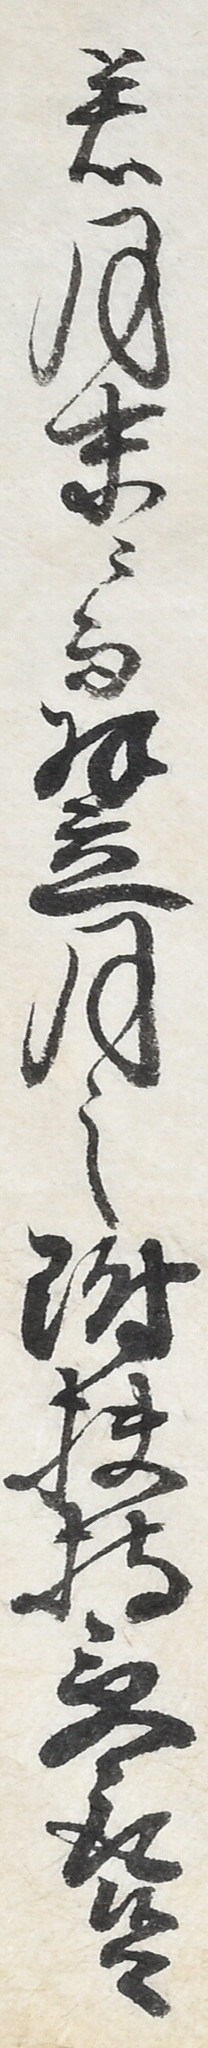若月末ニ而翌月之附扶持受取候ハヽ
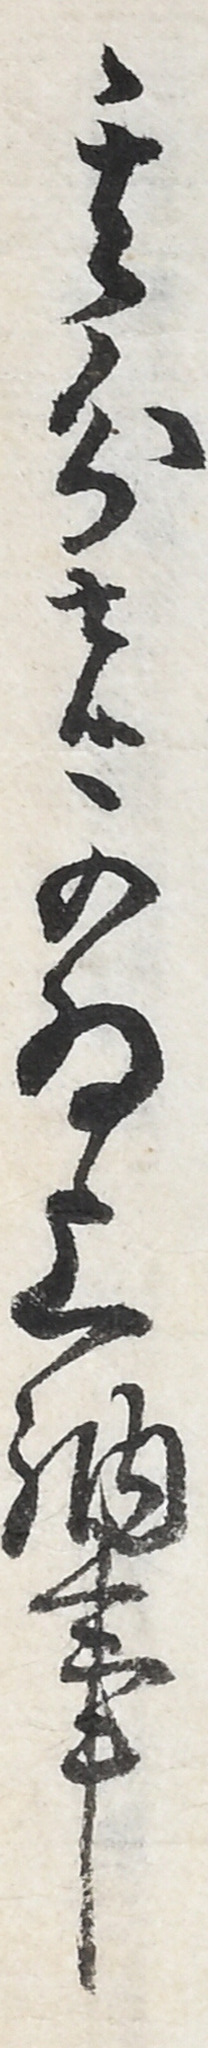其分は可為上納事

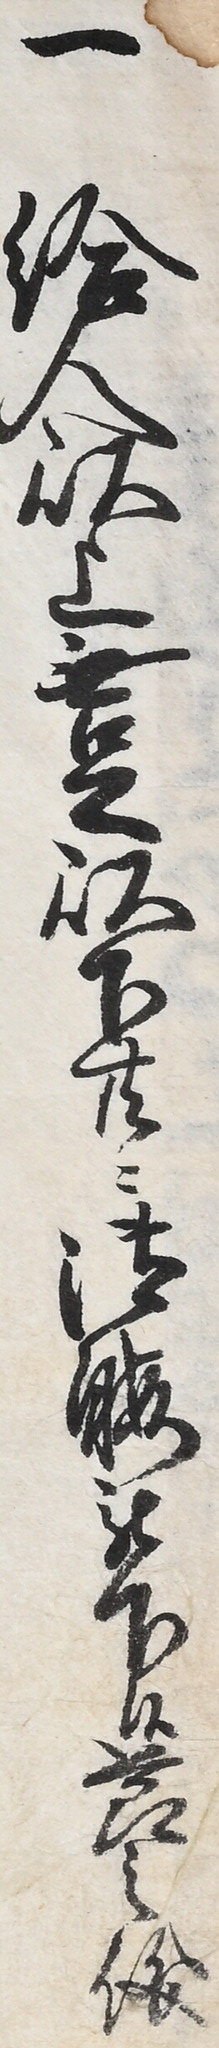一給人以上無足以下共ニ御聴被下候節之儀
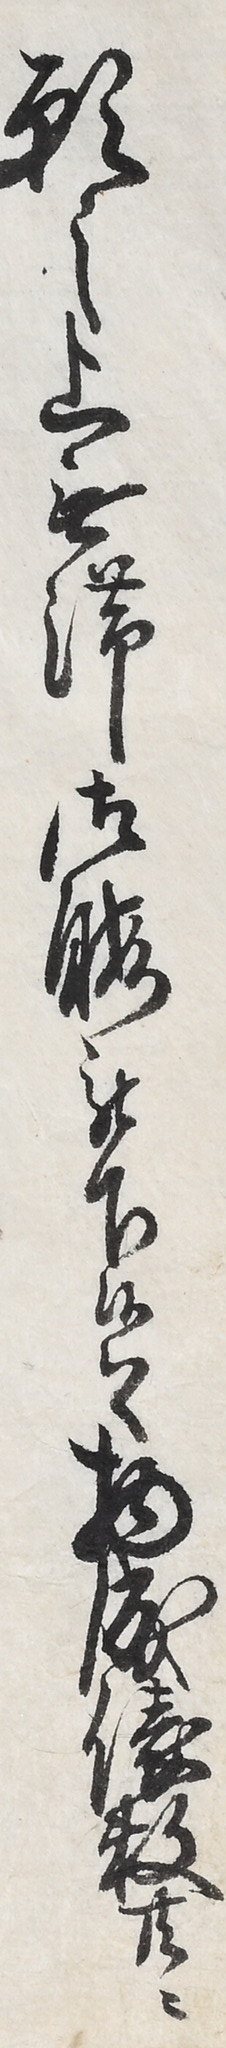願之上無滞御聴被下候ハヽ物成俵数共ニ
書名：御給分渡方之定
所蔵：伊那市立高遠町図書館・合同会社AMANE
